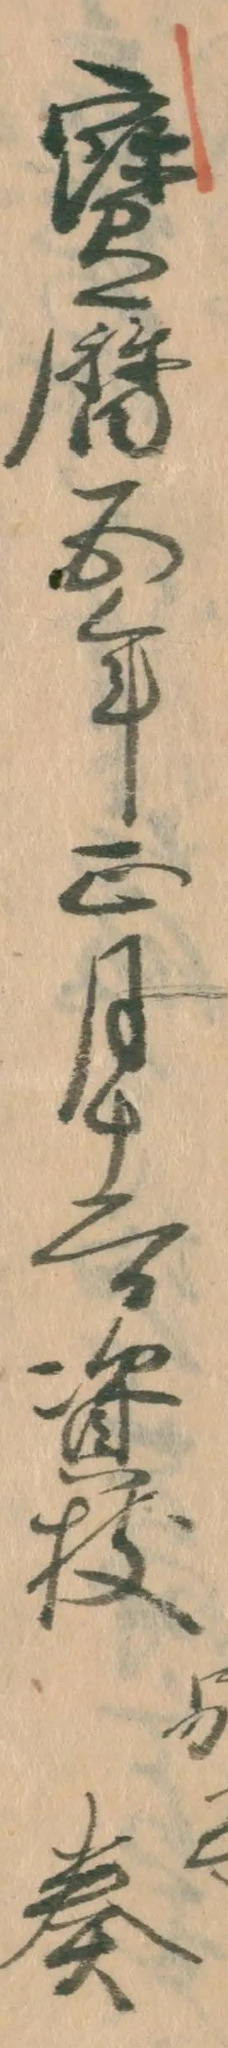宝暦五年正月十二日資枝別当奏
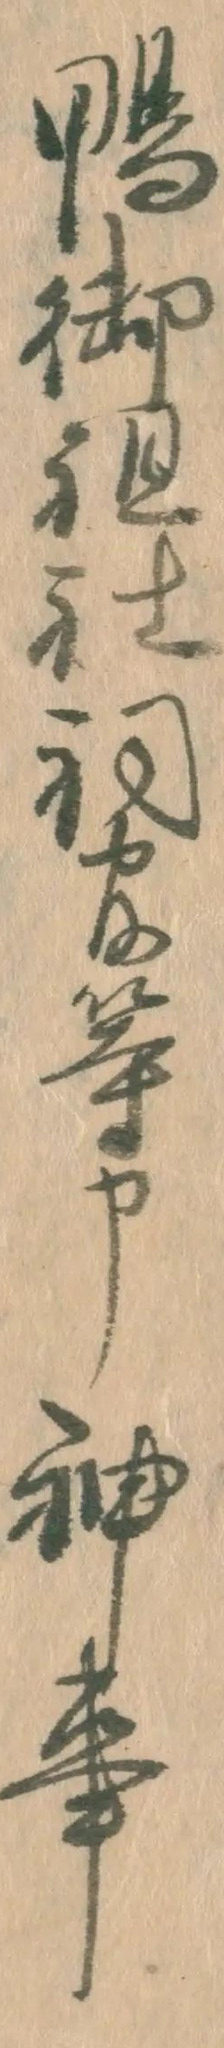鴨御祖社祠官等申神事
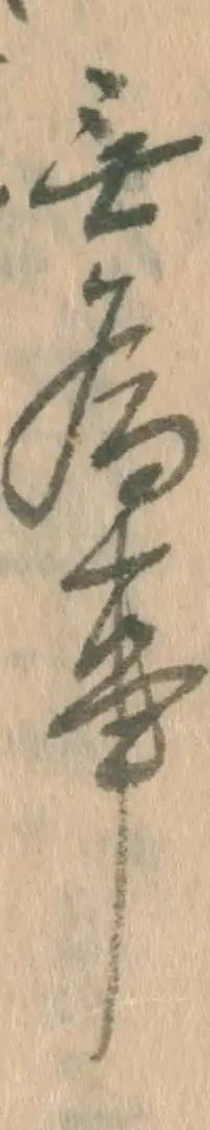無為事
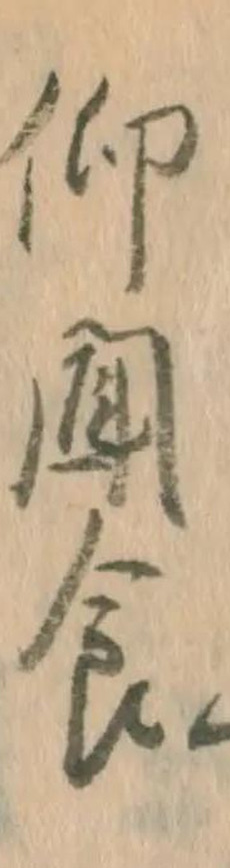仰聞食
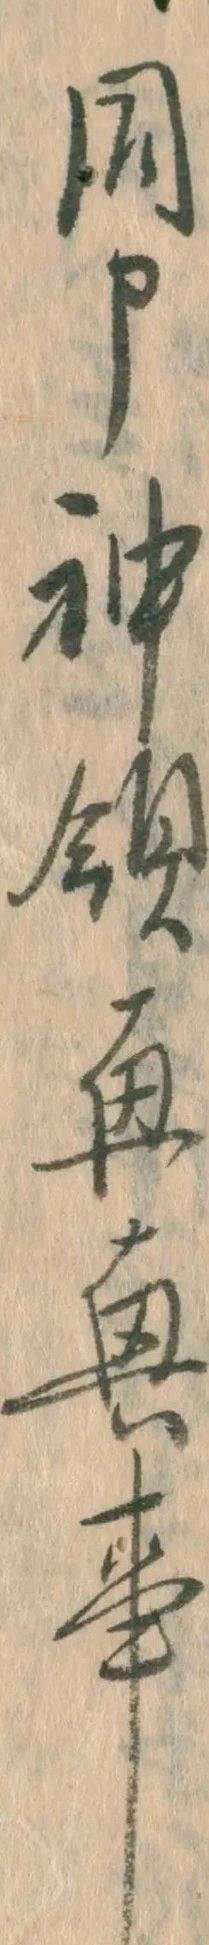同申神領再興事
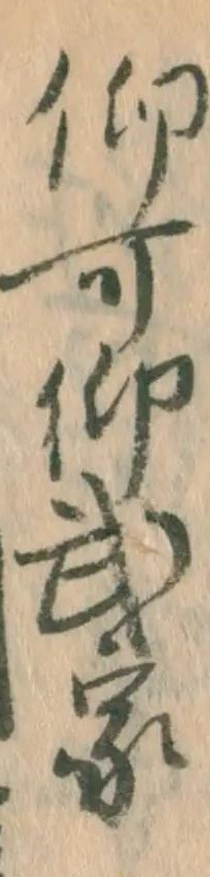仰可仰武家
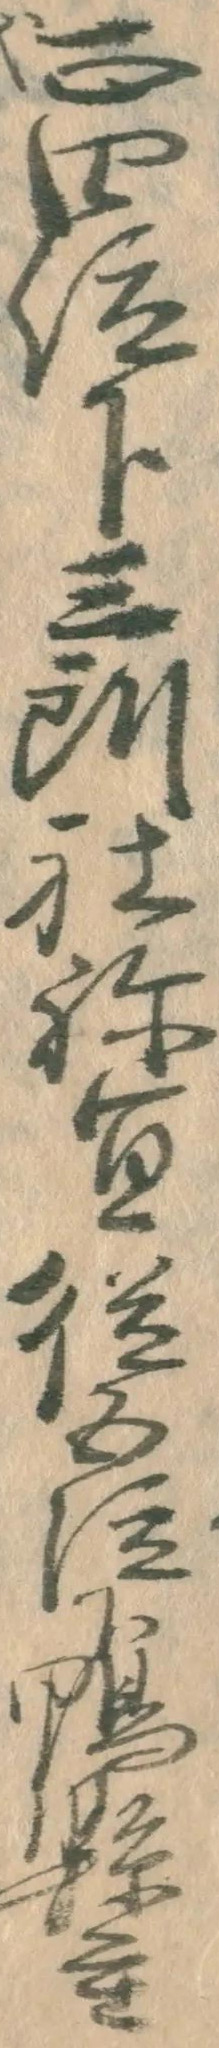正四位下三所社称宜従五位下鴨県主

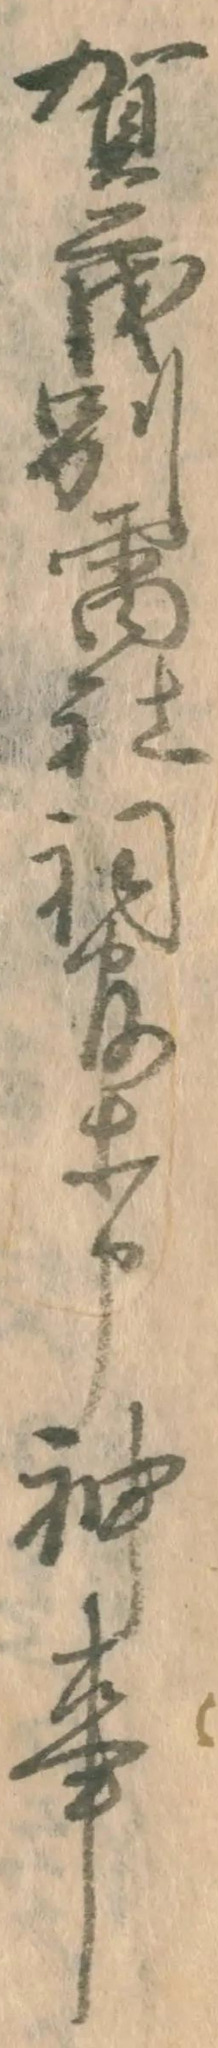賀茂別雷社祠官等申神事
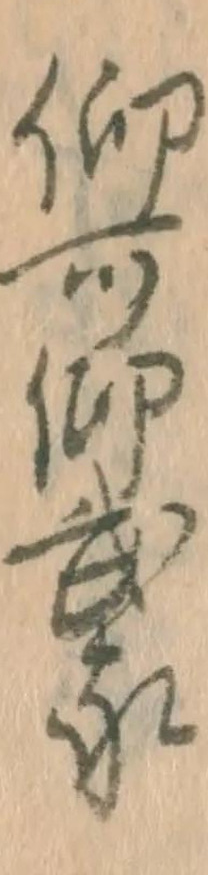仰可仰武家
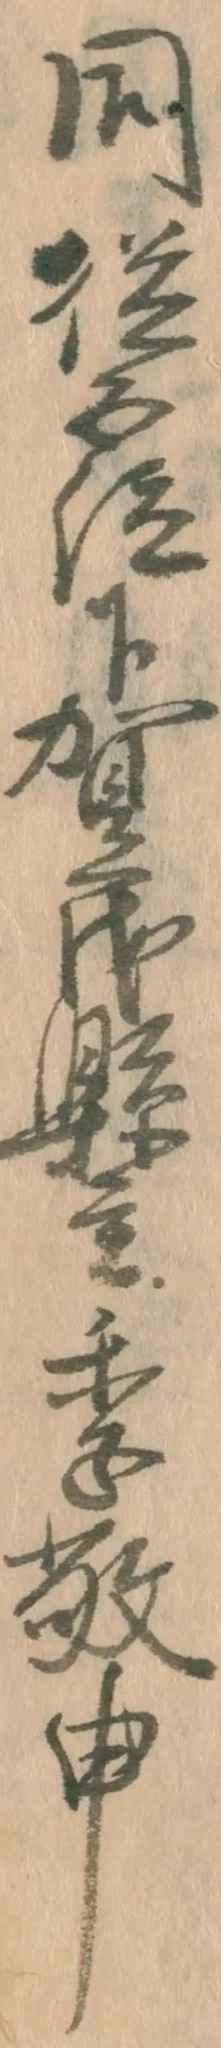同従五位下賀茂県主季敬申
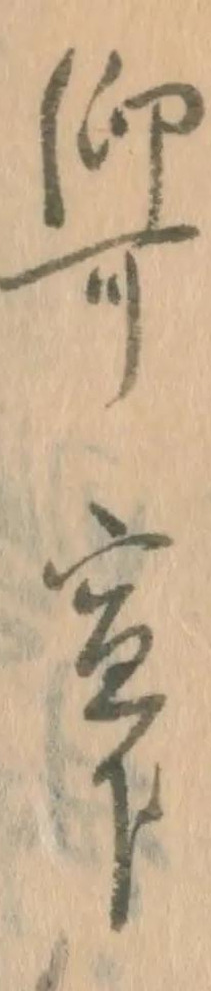仰可宣下
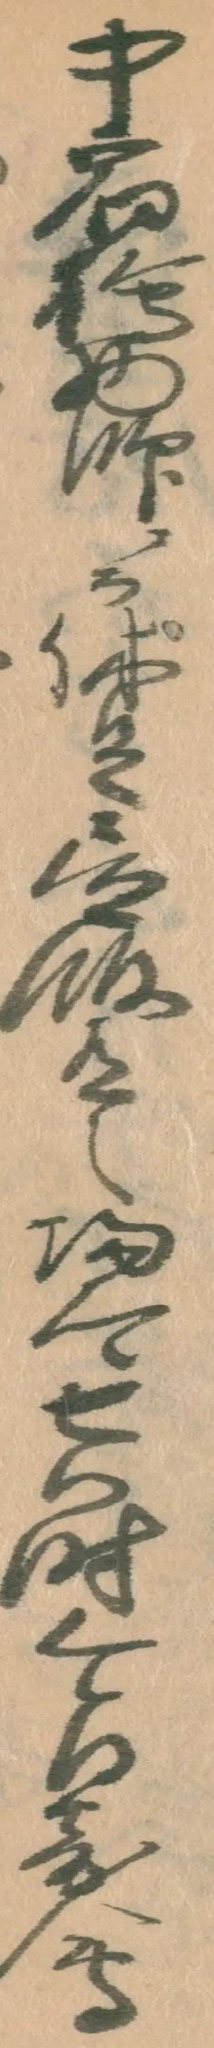中宿檜物師ニ而休足昼飯有之帰郷七ツ時今日寄会
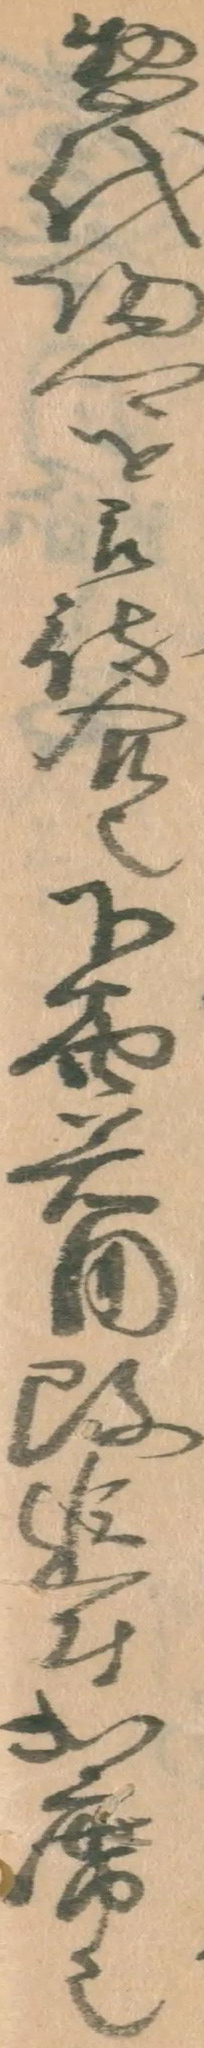惣代帰郷を被待合也下宿着用改追付出席也
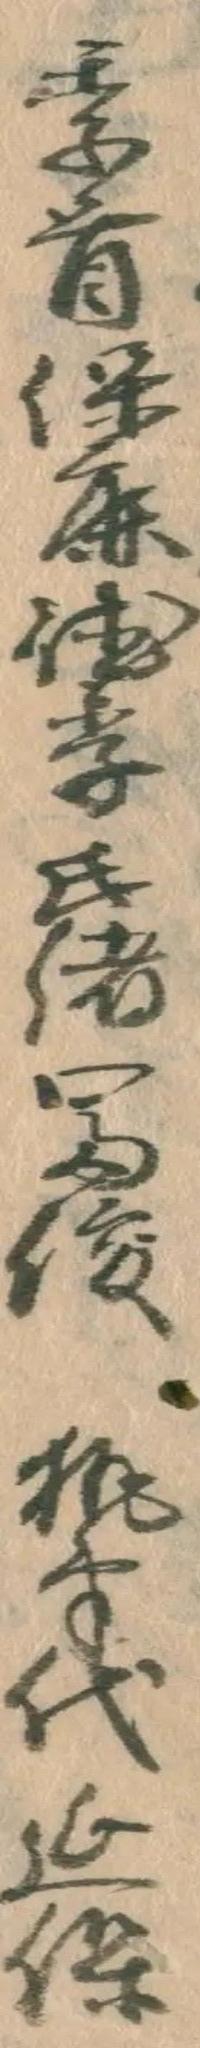季首保鹿徳季氏諸富俊執筆代延保
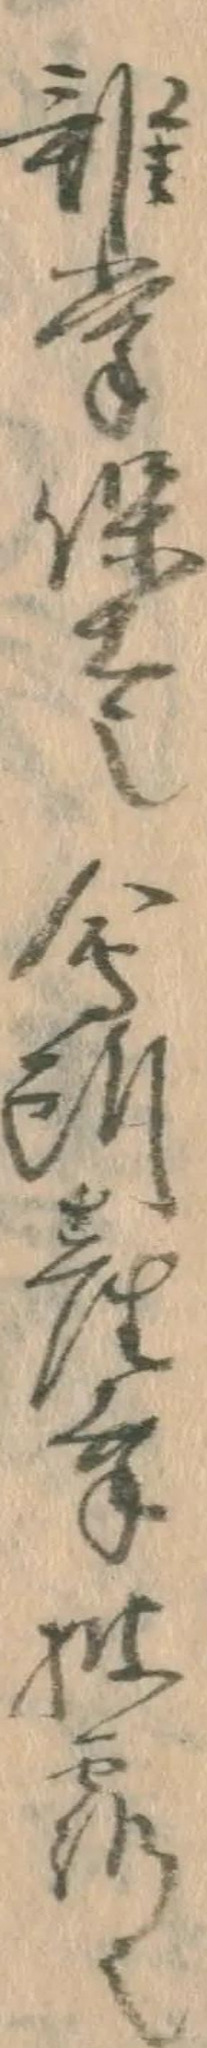雑掌保士也会所産幸披露也
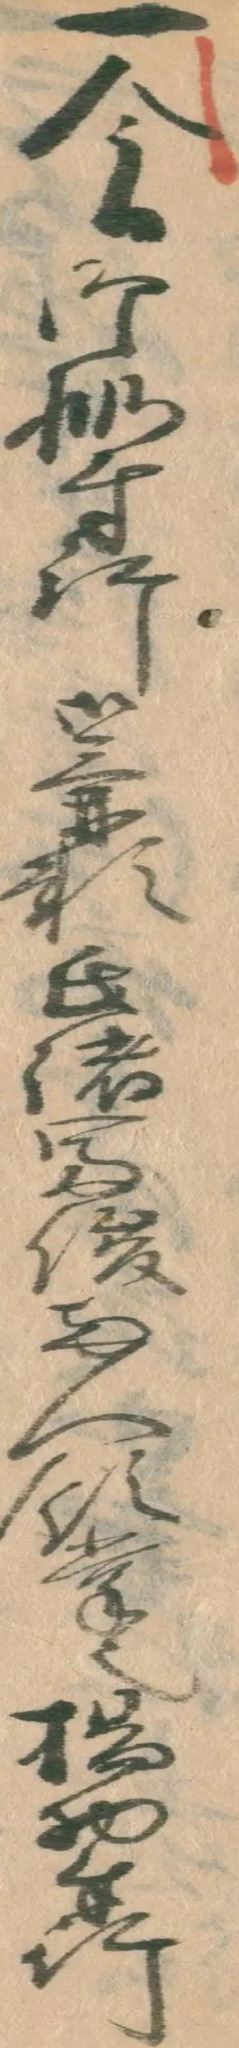一今日御棚奉行御兼頼氏諸富俊両人領掌也揚物奉行
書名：賀茂社記録. 第60冊
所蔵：国立国会図書館 National Diet Library, JAPAN
